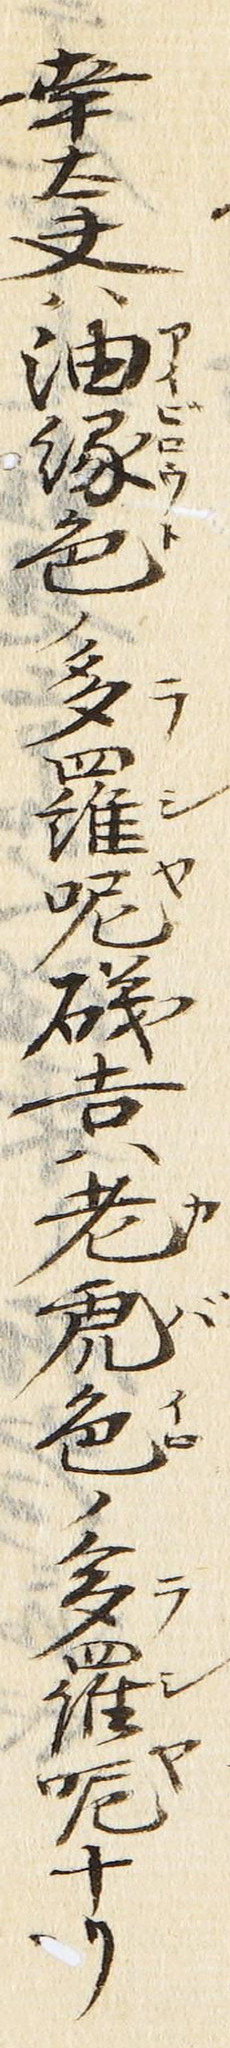幸太夫は油縁色の多羅呢磯吉は老虎色の多羅呢なり
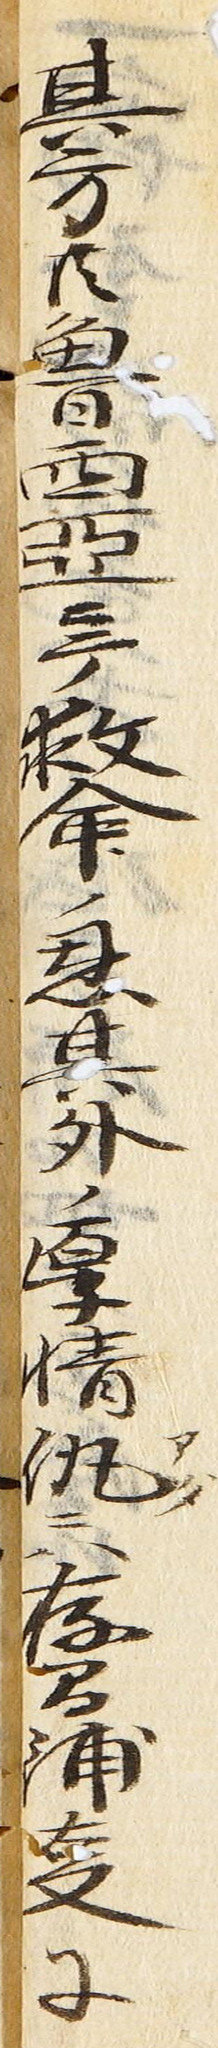其方共魯西亜にて救命の恩其外の厚情仇には存間敷事に
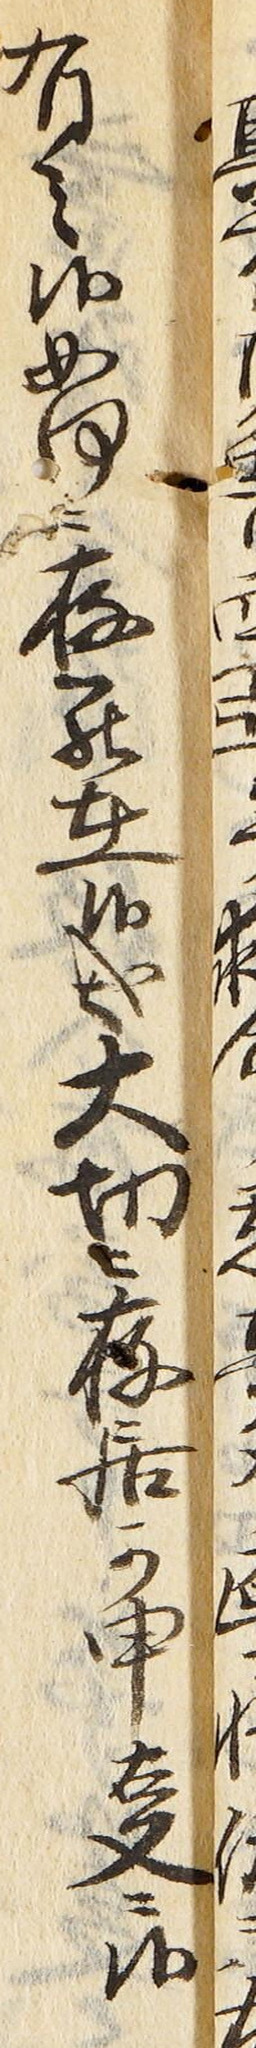有之候如何に存罷在候哉大切に存居可申事に候
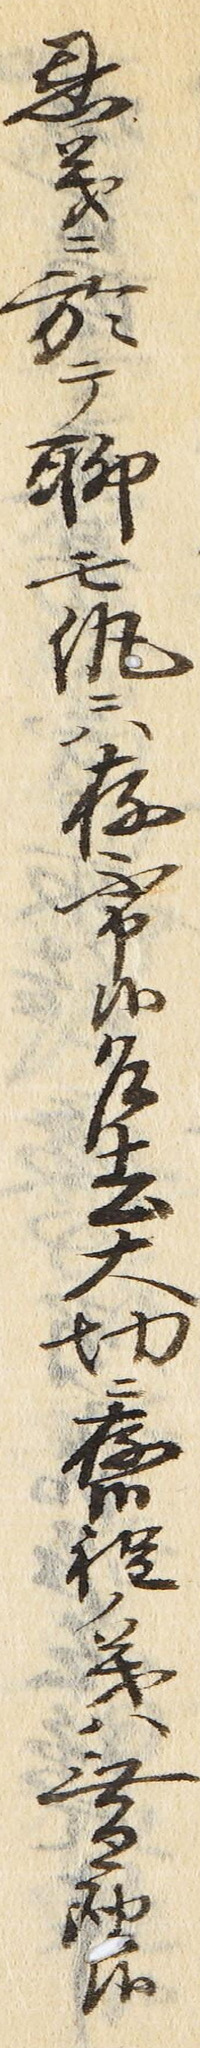恩義に於て聊も仇には存不申候乍去大切に存候程の義は無御座候
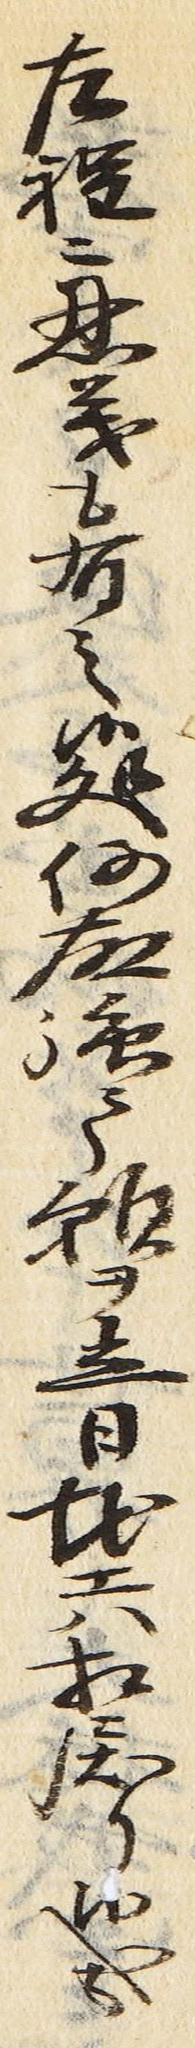左程に恩義も有之候処何故強て願を立日本えは相戻候哉
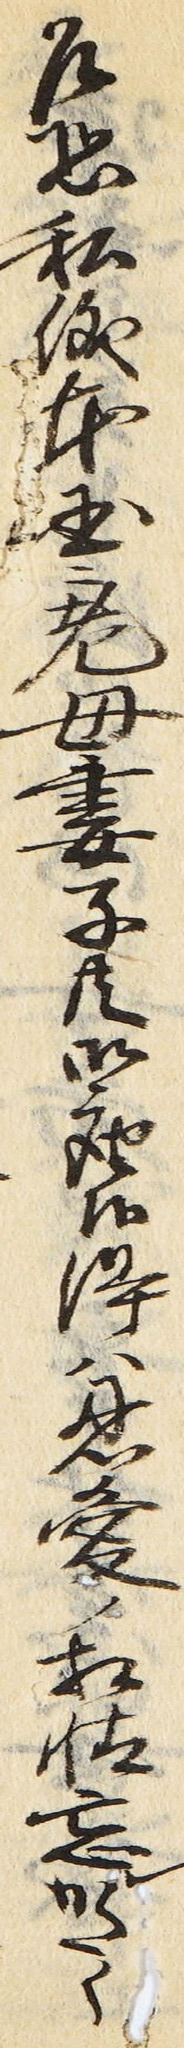乍恐私儀本国に老母妻子共御座候得は恩愛の相情忘れかたく
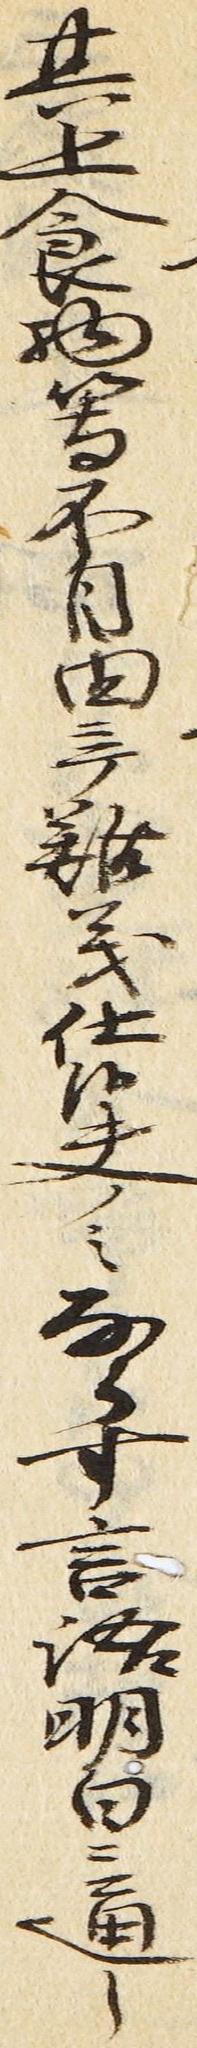其上食物等不自由にて難義仕候夫のみならす言語明白に通し
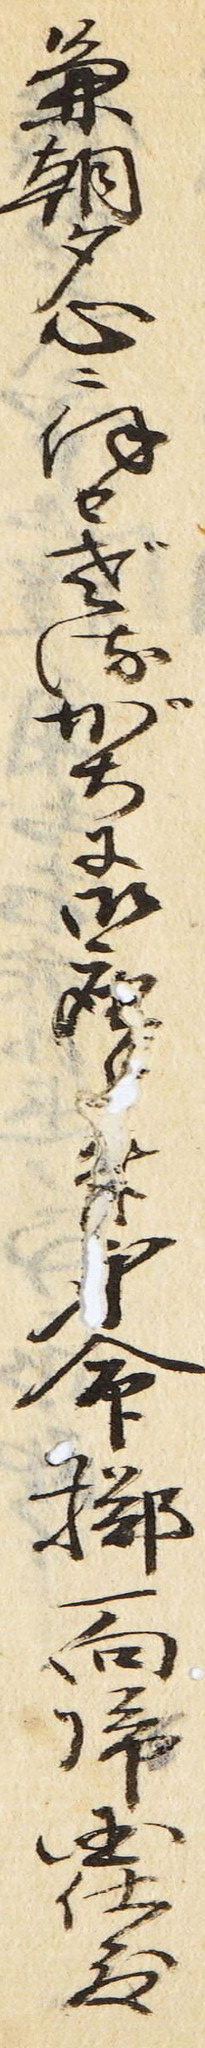兼朝夕心に任せざるがちに御座候に付身命擲一向帰国仕度
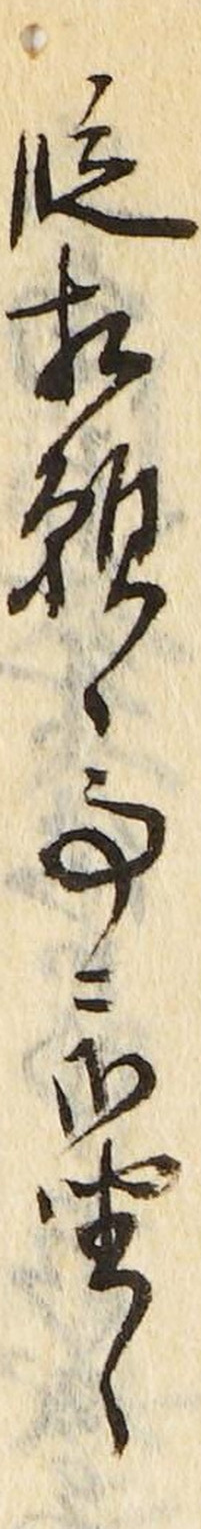段相願候事に御座候
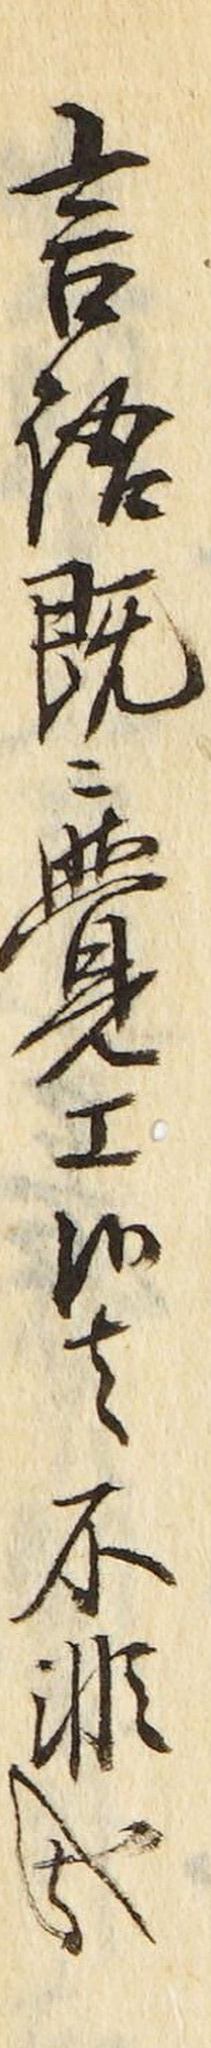言語既に覚え候は不非哉

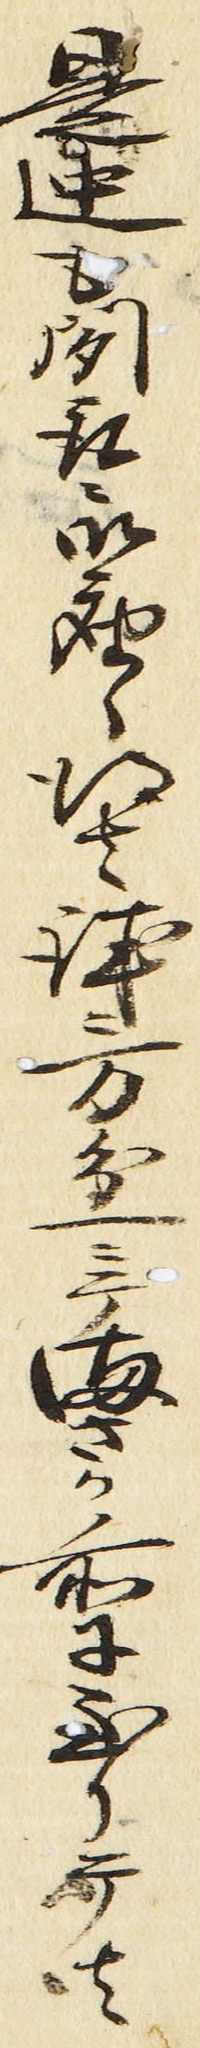是迄も聞取りに御座候得は誠に万分一にてまさかの所に至りては
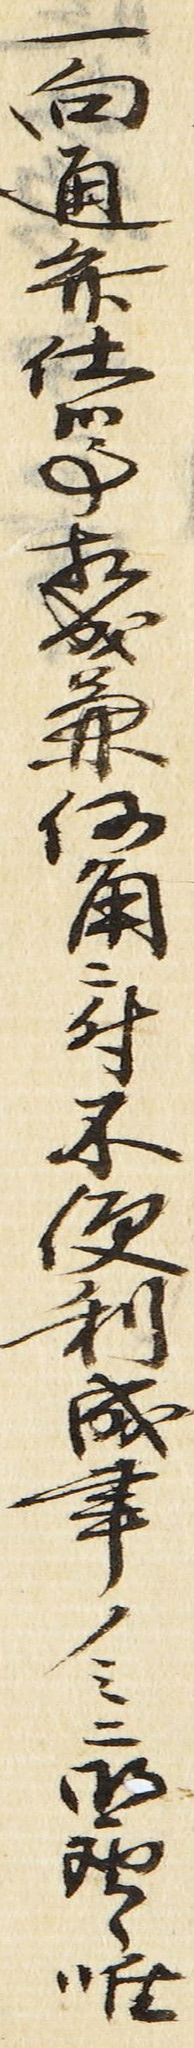一向通弁仕候事相成兼何角に付不便利成事のみに御座候唯
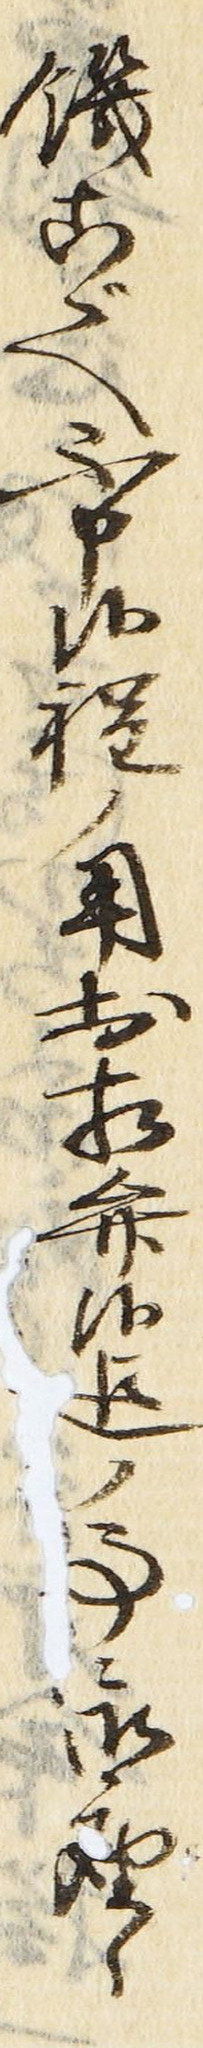饑こゞへ不申候程の用於相弁候迄の殊に御座候
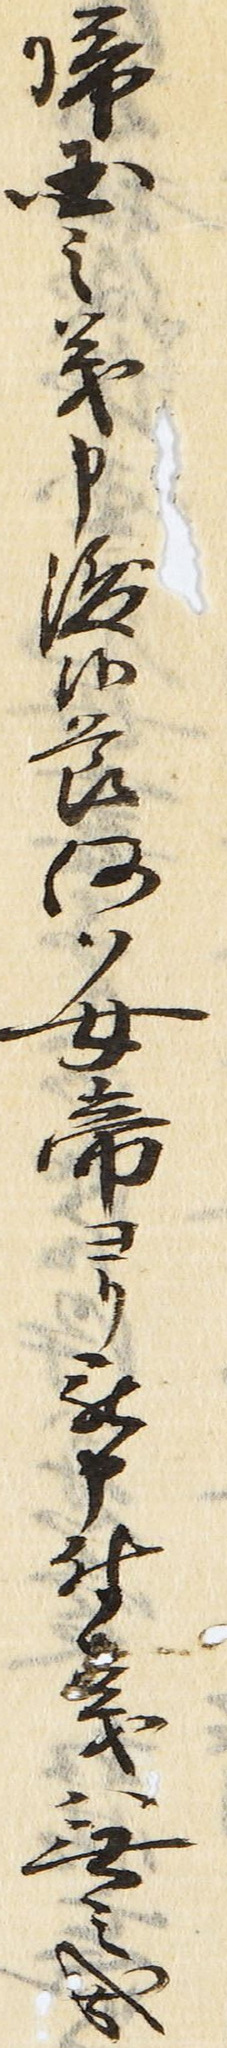帰国之義申渡候節何そ女帝より被申付候義は無之哉
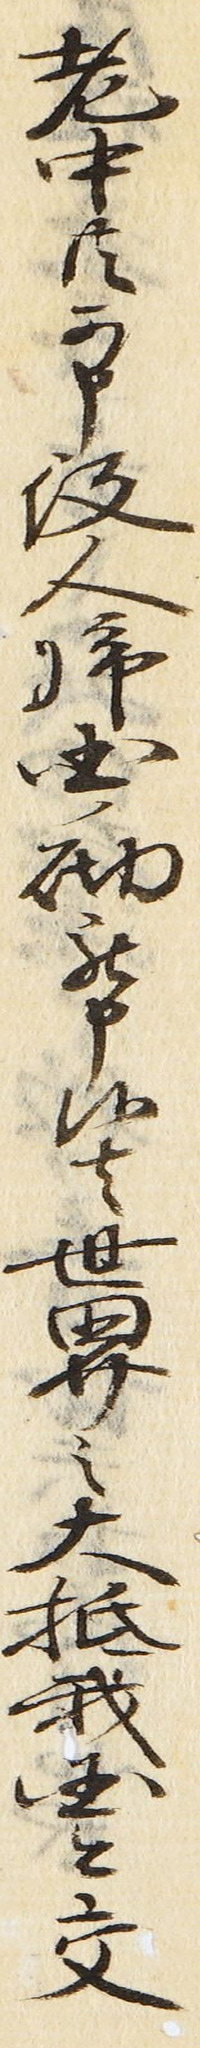老中共可申役人帰国の砌被申候は世界の大抵我国と交
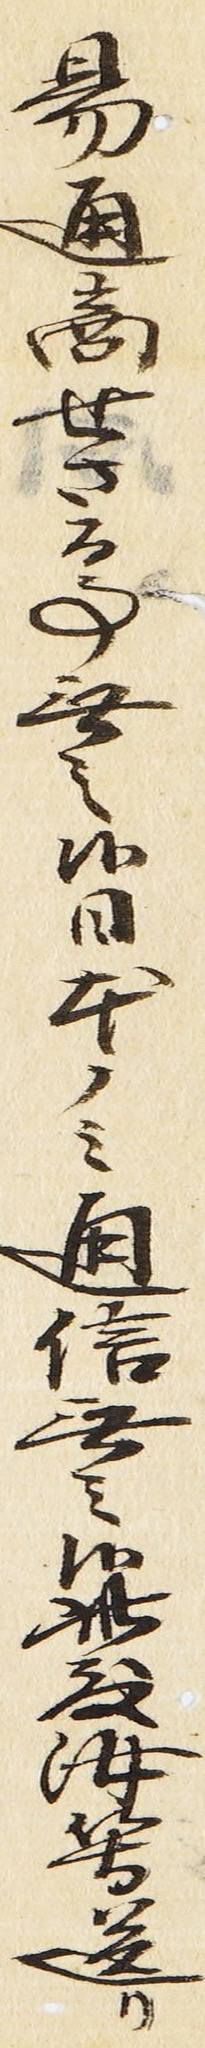易通商せさる事無之候日本のみ通信無之候此度汝等送り
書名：神昌丸漂流問答
